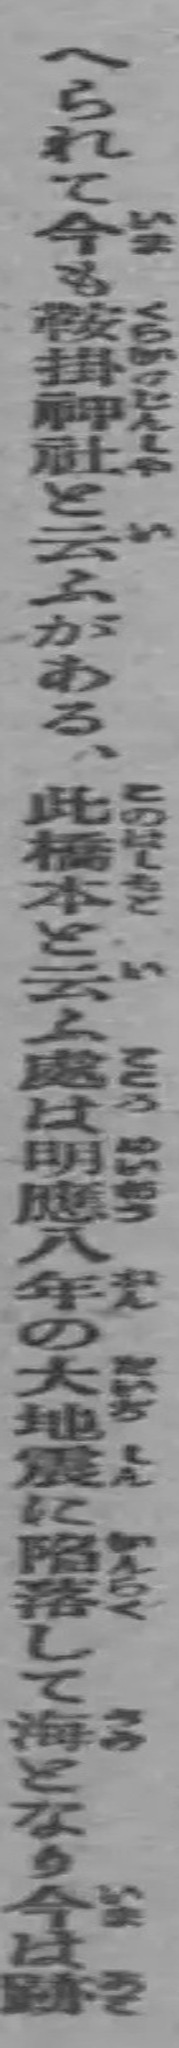へられて今も鞍掛神社と云ふがある、此橋本と云ふ処は明応八年の大地震に陥落して海となり今は跡

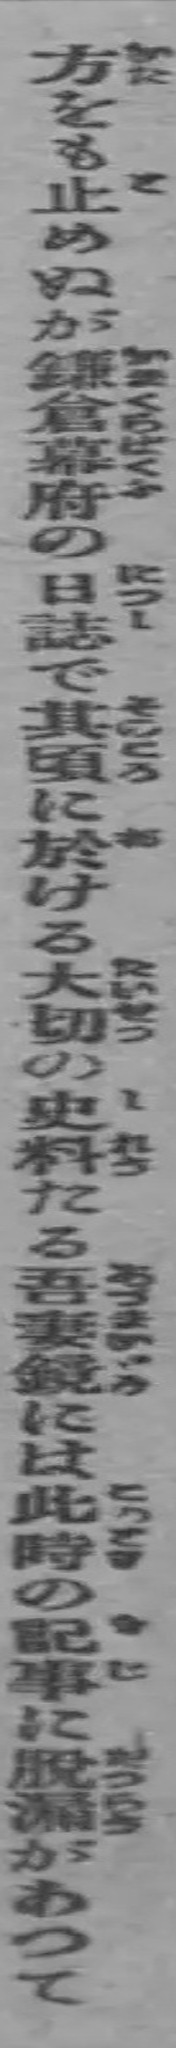方をも止めぬが鎌倉幕府の日誌で其頃に於ける大切の史料たる吾妻鏡には此時の記事に脱漏があつて
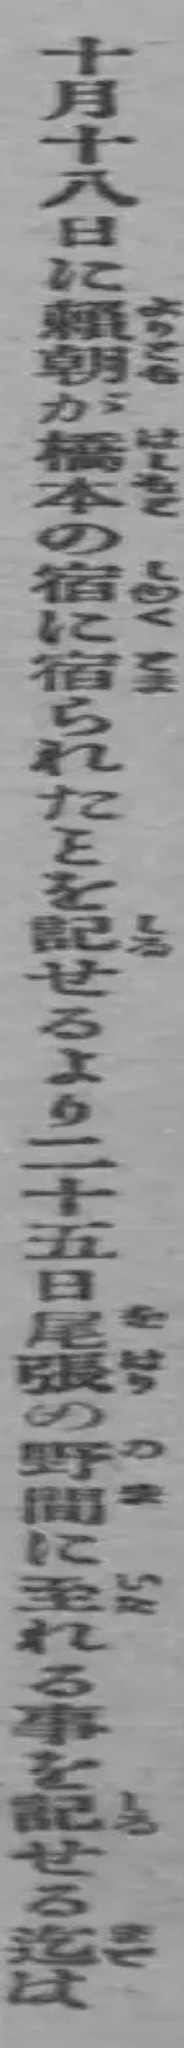十月十八日に頼朝が橋本の宿に宿られたことを記せるより二十五日尾張の野間に至れる事を記せる迄は
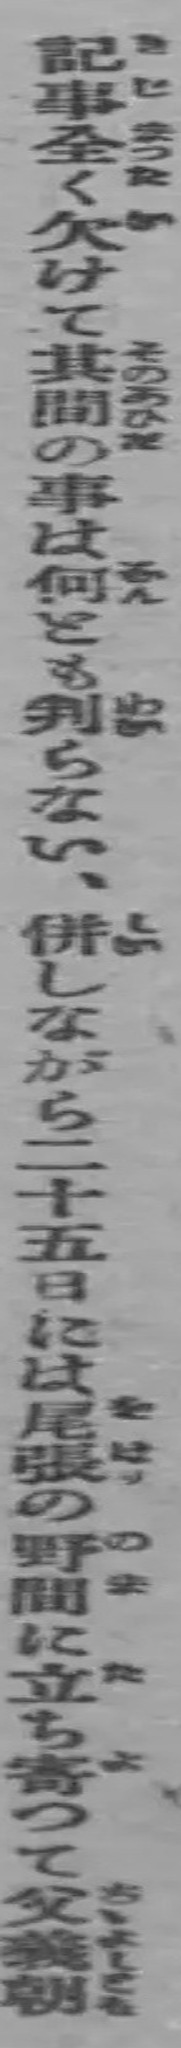記事全く欠けて其前のこと事は何とも判らない、併しながら二十五日には尾張の野間に立ち寄つて父義朝
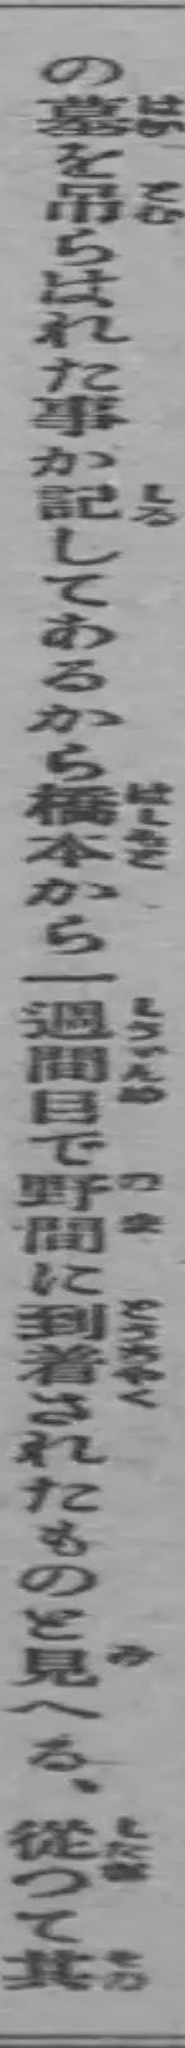の墓を吊らはれた事か記してあるから橋本から一週間目で野間に到着されたものと見へる、従つて其
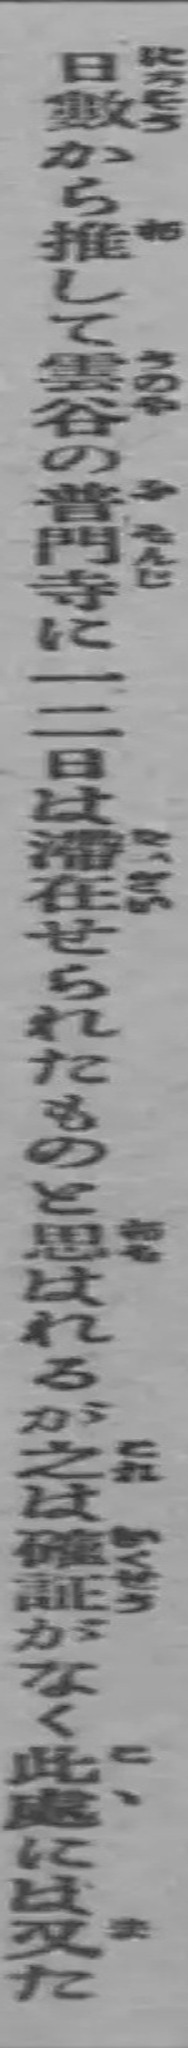日数から推して雲谷の普門寺に一二日は滞在せられたものと思はれるが之は確証がなく此処には又た
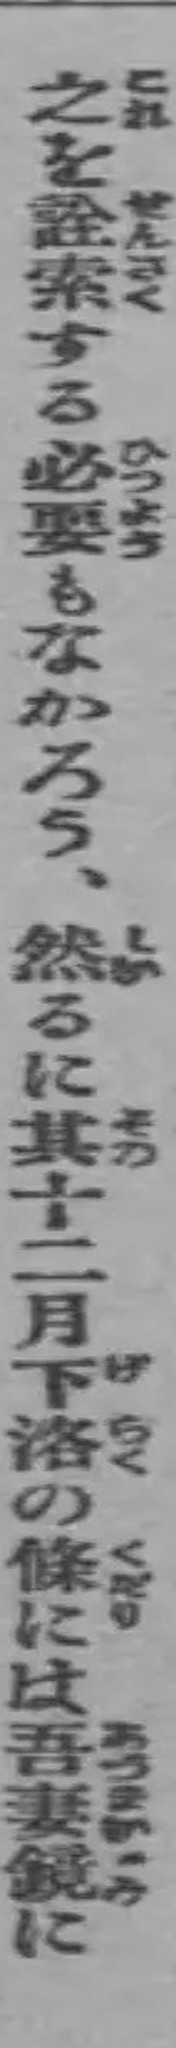之を詮索する必要もなかろう、然るに其十二月下落の条には吾妻鏡に
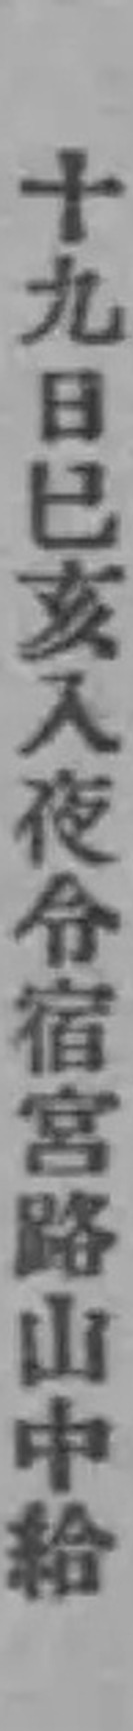十九日巳亥入夜令宿宮路山中給
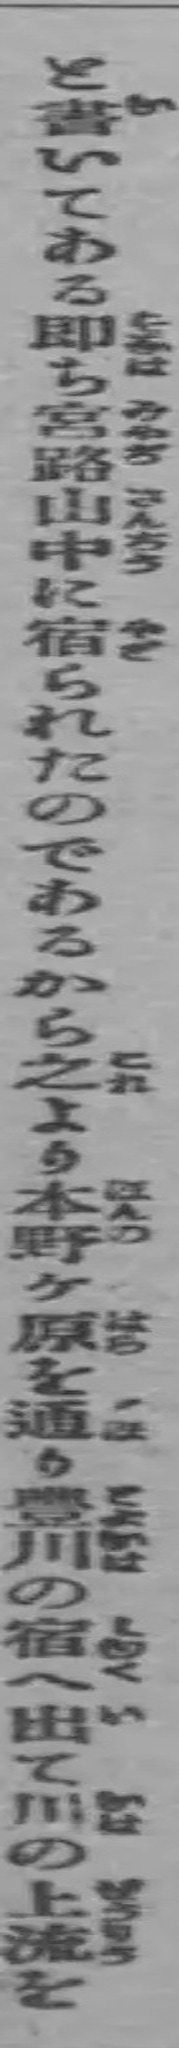と書いてある即ち宮路山中に宿られたのであるから之より本野ケ原を通り豊川の宿へ出て川の上流を
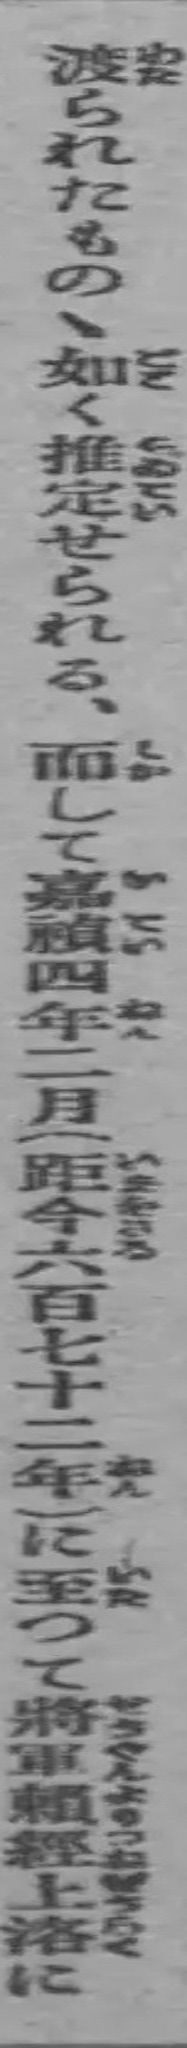渡られたものゝ如く推定せられる、而して嘉禎四年二月(距今六百七十二年)に至つて将軍頼経上洛に
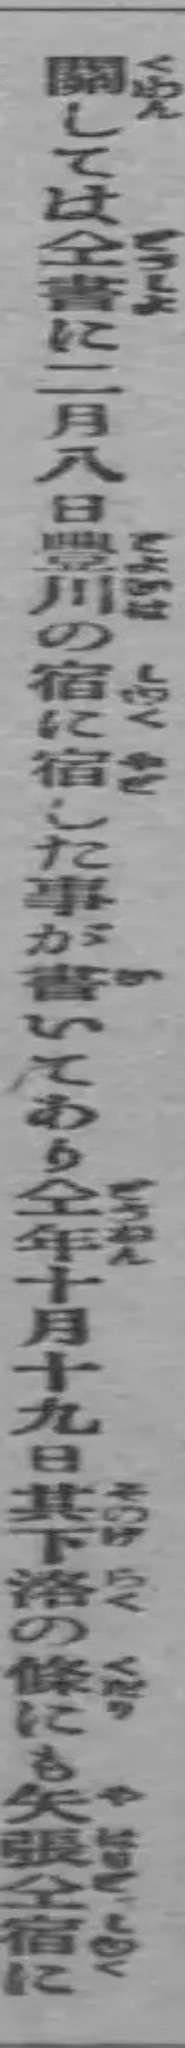関しては仝書に二月八日豊川の宿に宿した事が書いてあり仝年十月十九日其下落の条に矢張仝宿に
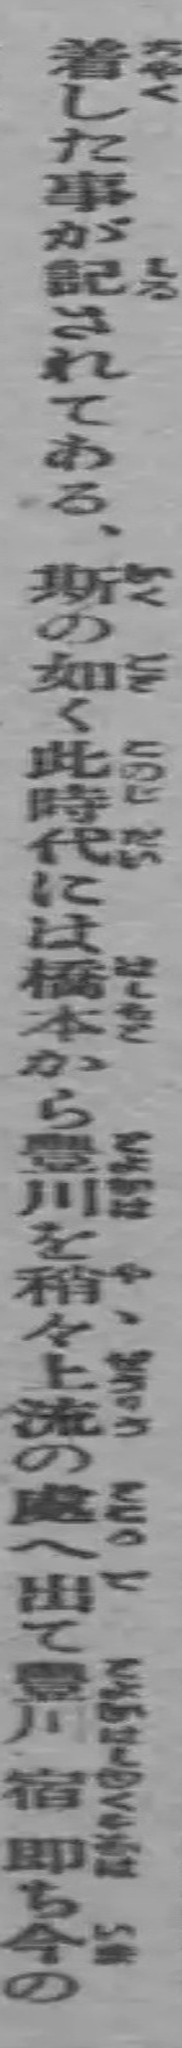着した事が記されてある、斯の如く此時代には橋本から豊川を稍々上流の処へ出て豊川宿即ち今の
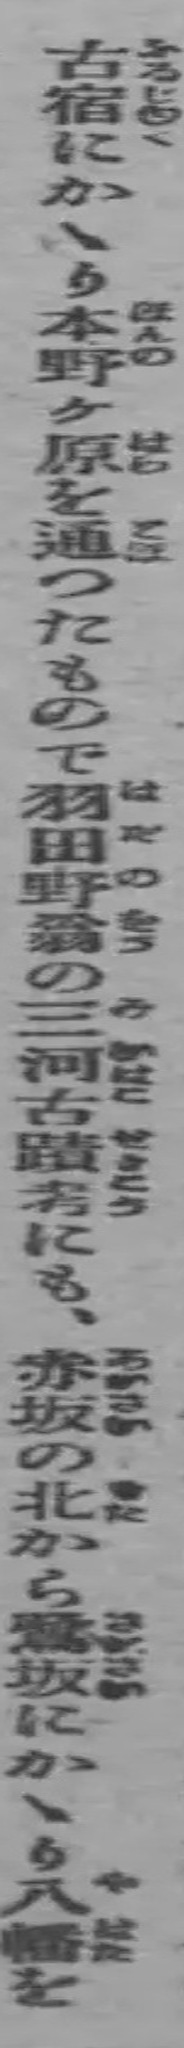古宿にかゝり本野ケ原を通つたもので羽田野翁の三河古蹟考にも、赤坂の北から鷺坂にかゝり八幡を
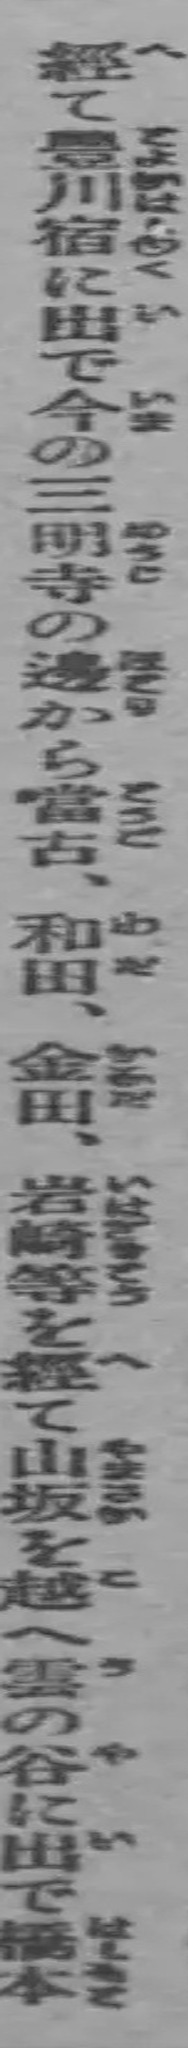経て豊川宿に出で今の三明寺の辺から当古、和田、金田、岩崎等を経て山坂を越へ雲の谷に出で橋本
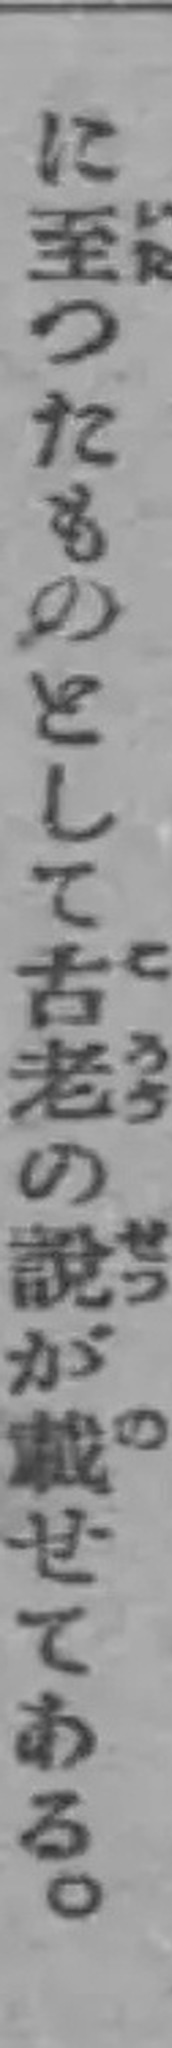に至つたものとして古老の説が載せてある。
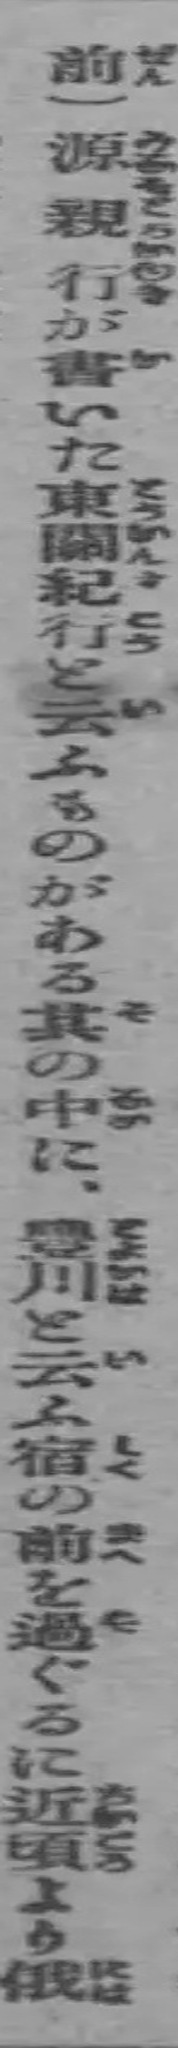前)源親行が書いた東関紀行と云ふものがある其の中に、豊川と云ふ宿の前を過ぐるに近頃より俄
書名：豊橋市史談
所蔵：国立国会図書館 National Diet Library, JAPAN
